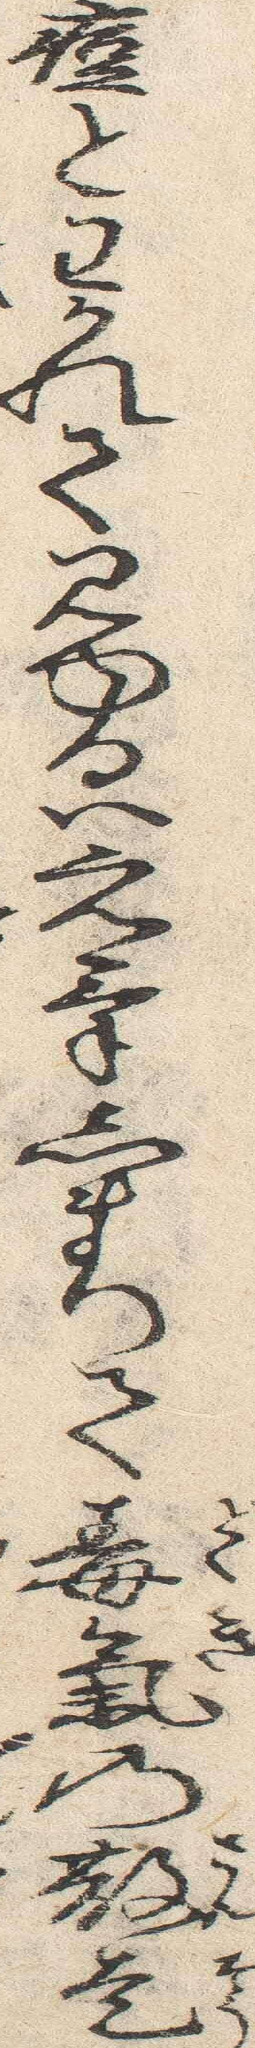痘とわかれて見ゆるは元気しまりて毒気の散走
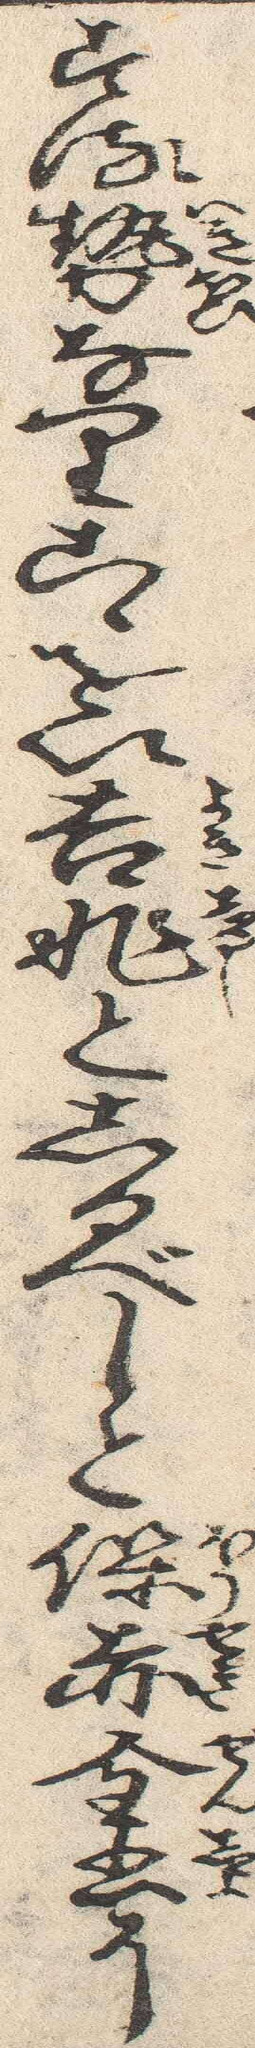する勢なりこゝを以吉兆としるべしと保赤全書に
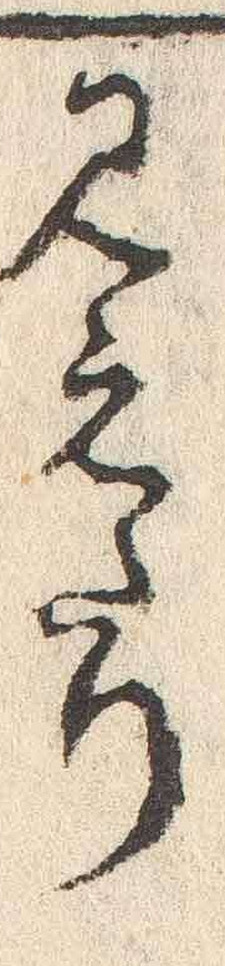見えたり
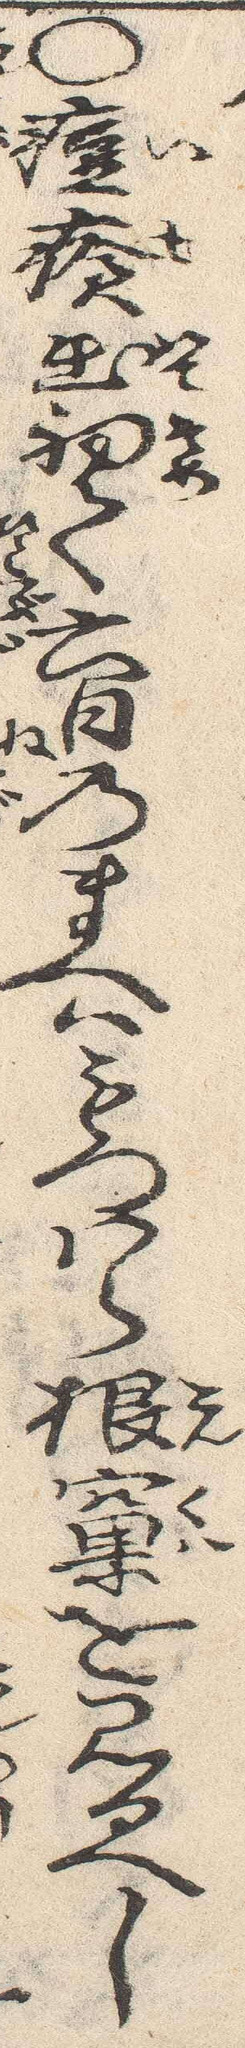○痘瘡出初て六日のまへはもつはら根窠を見るへし
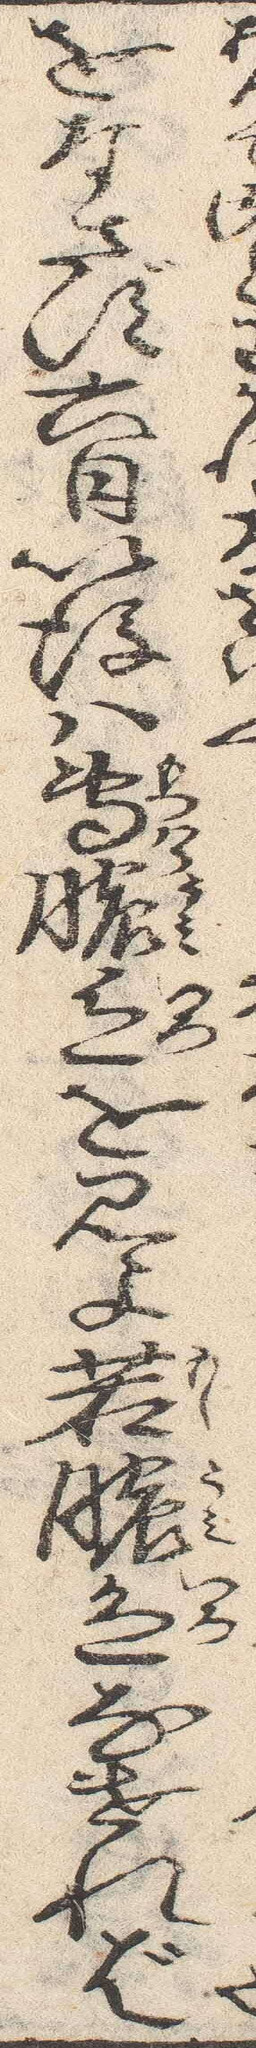をなさず六日以後は専膿色を見よ若膿色なければ
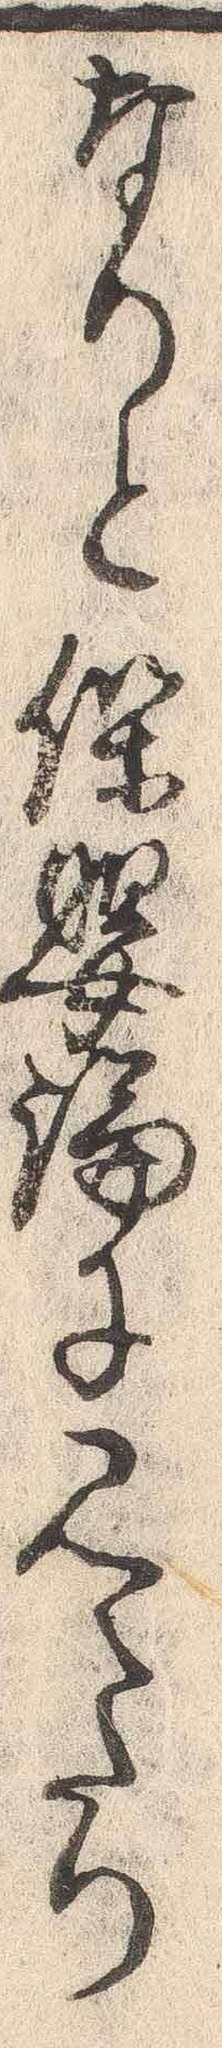なりと保嬰論に見えたり
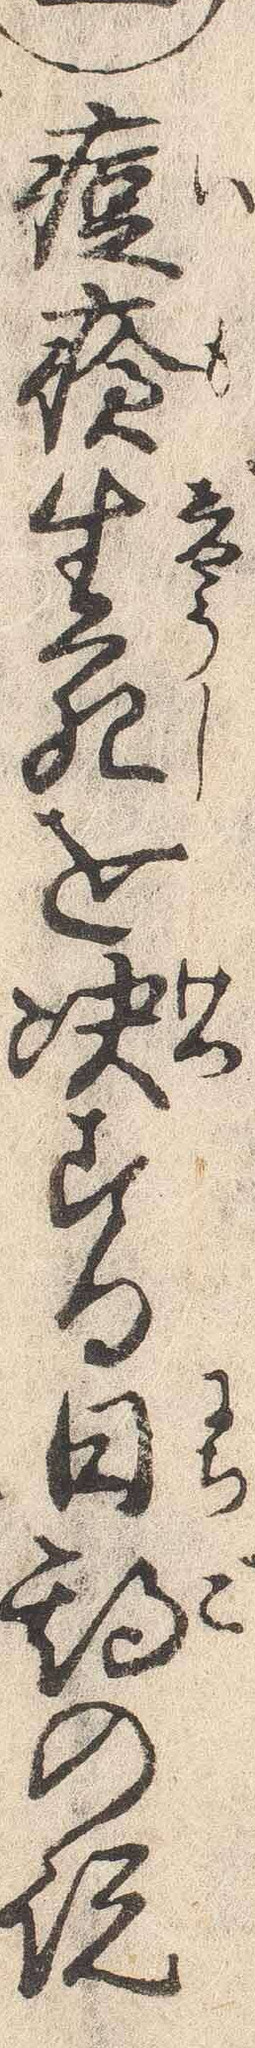(十一)痘瘡生死を決する日期の説
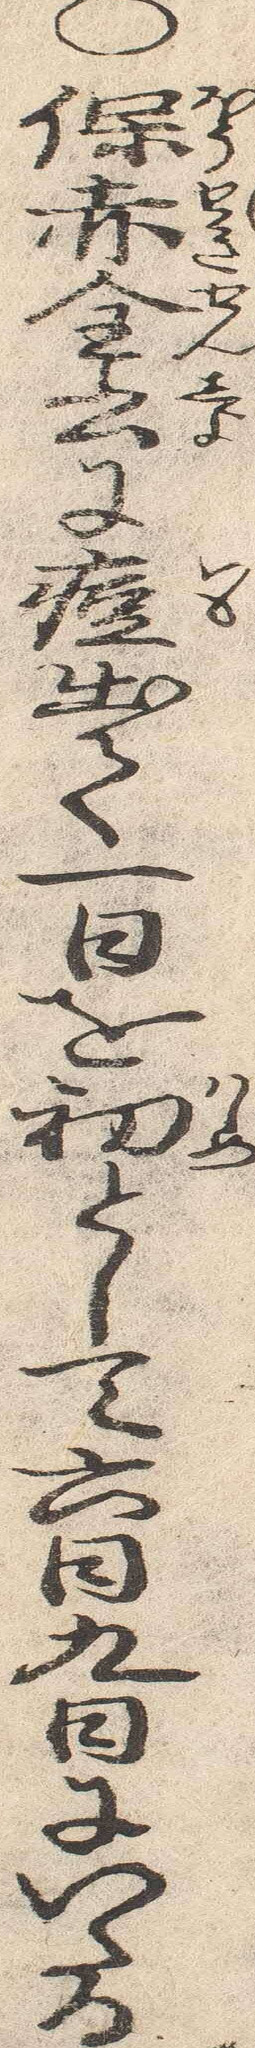○保赤全書に痘出て一日を初として六日九日にいたる
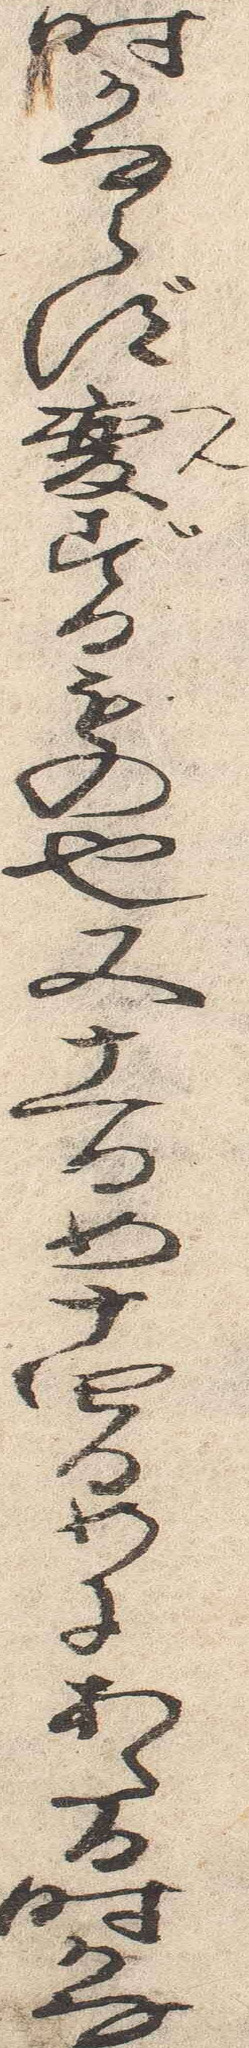時かならず変ずるもの也又十一日め十四日めにあたる時かな
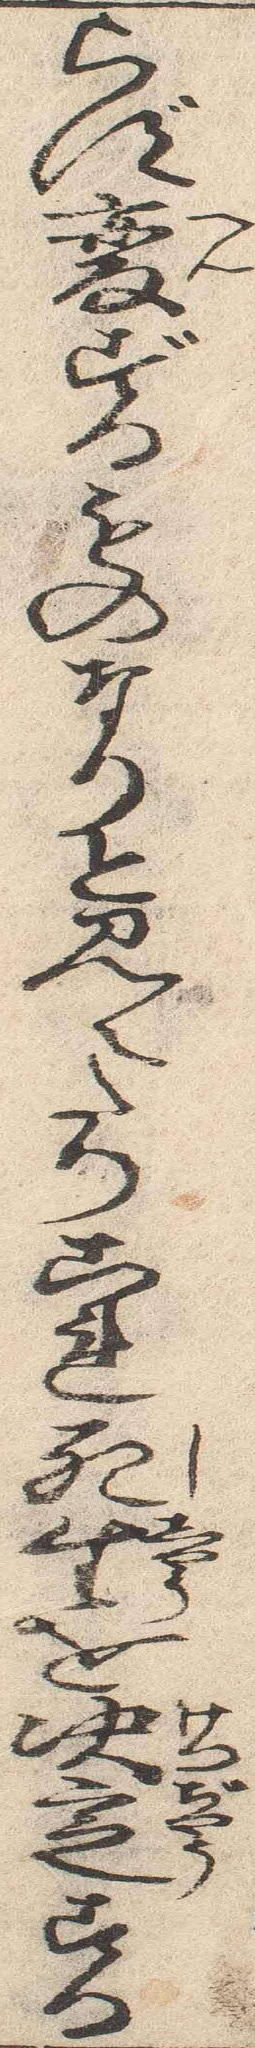らず変ずるものなりと見えたりこれ死生を決定する
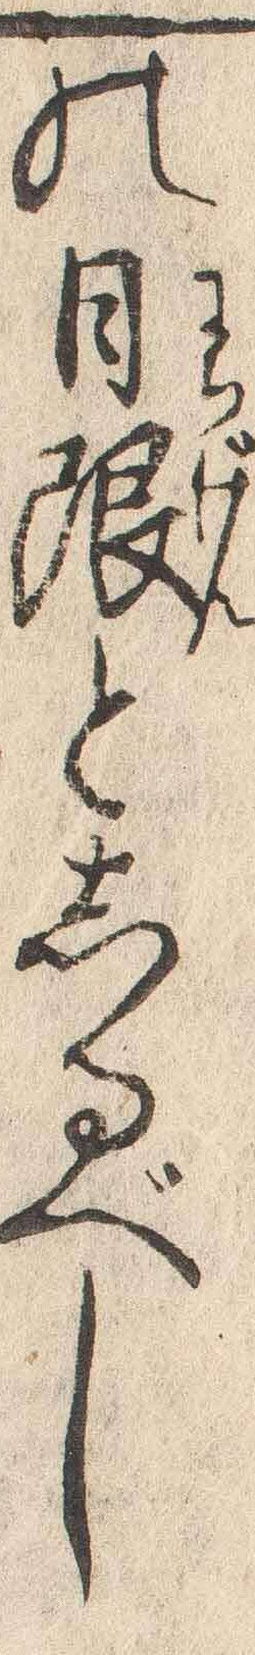の日限としるべし
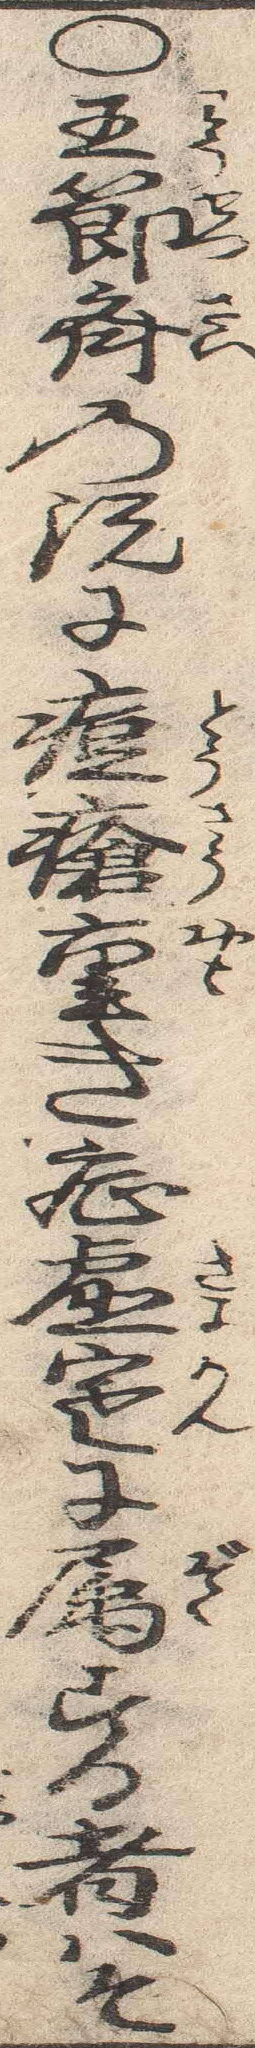○王節斉の説に痘瘡重き症虚寒に属する者はそ
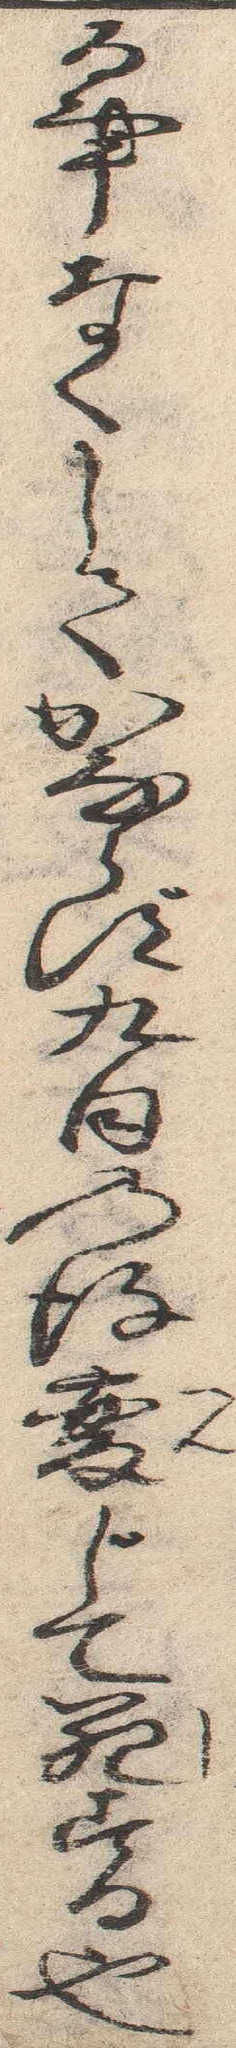る事なくしてかならず九日の後変じて死する也
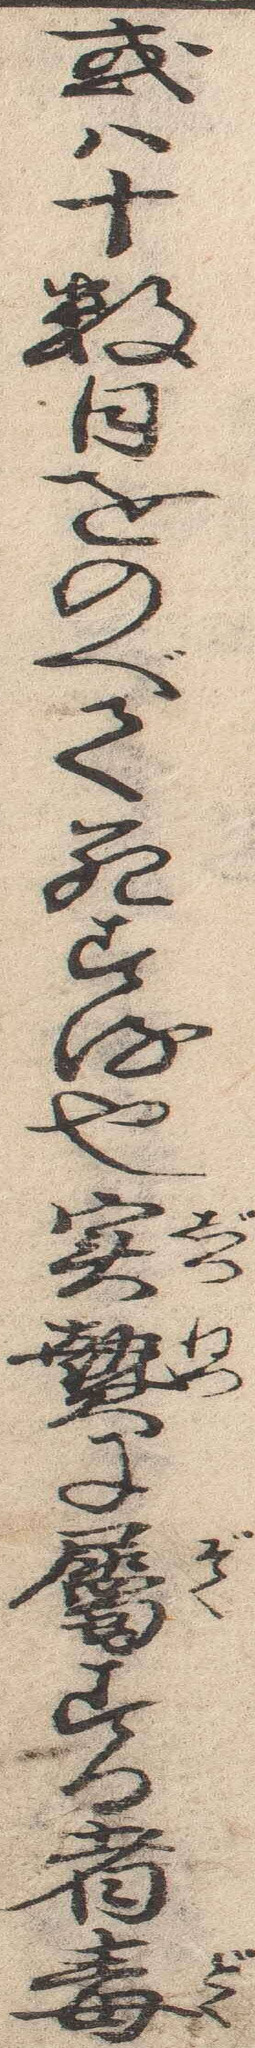或は十数日をのべて死する也実熱に属する者毒

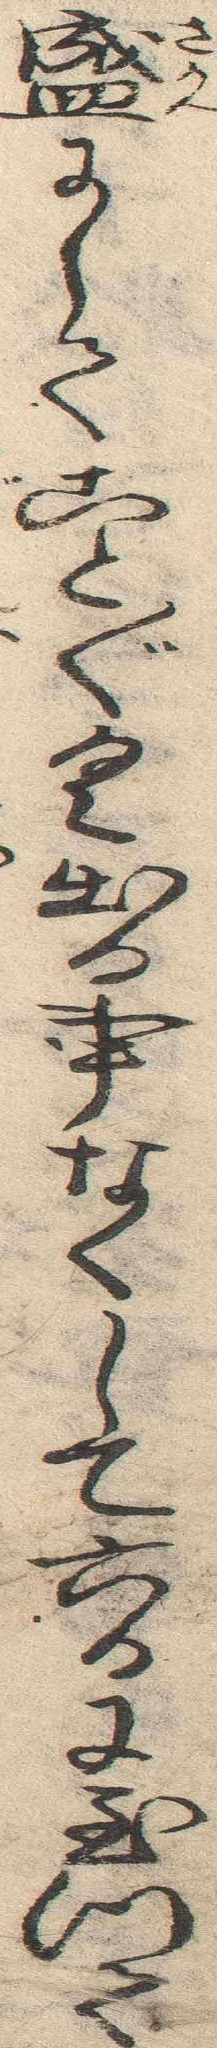盛にしてこと〴〵く出る事なくして六日に至つて
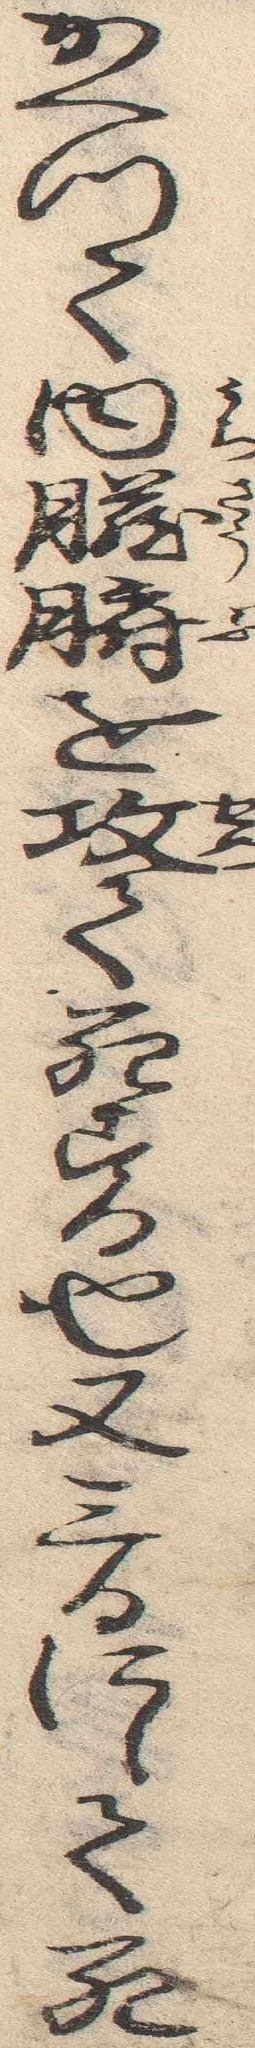かへつて内臓腑を攻て死する也又三日にして死
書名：小児必用養育草
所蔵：東京学芸大学附属図書館 国文学研究資料館
